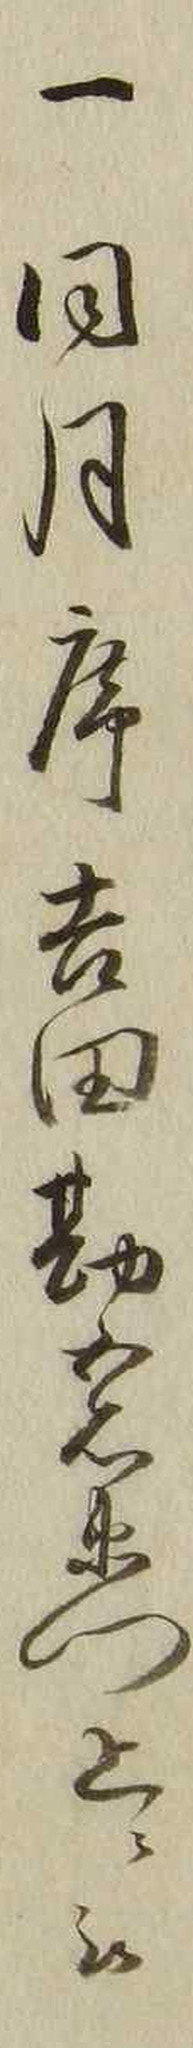一同月席吉田勘五右衛門上ニ被
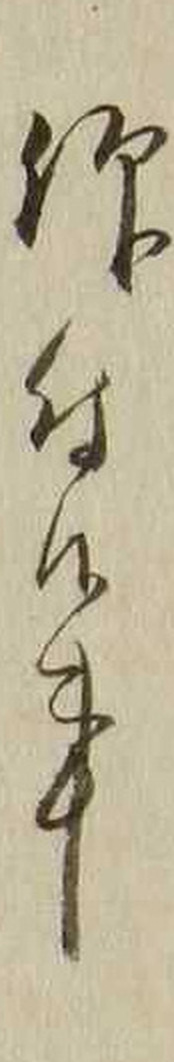仰付候事
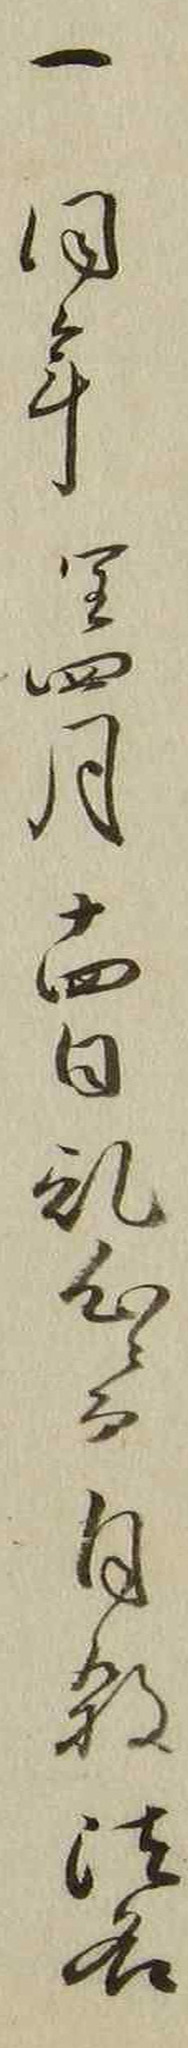一同年閏四月十四日乱心ニ而自殺法名
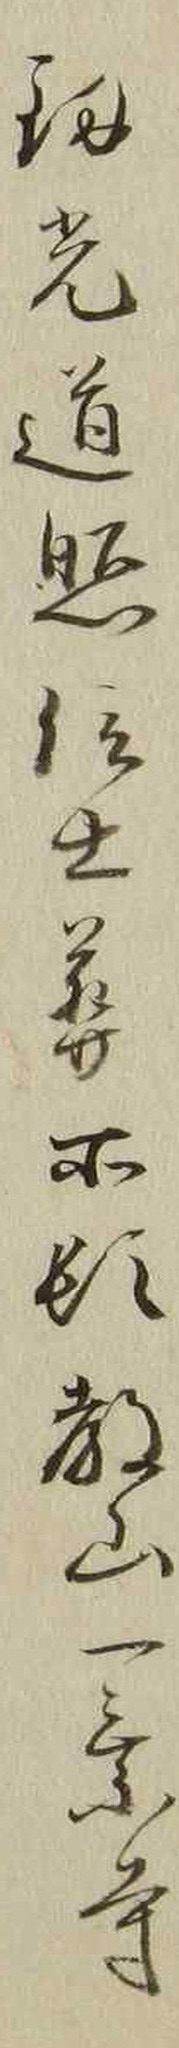釼光道照信士葬所頓教山一乗寺
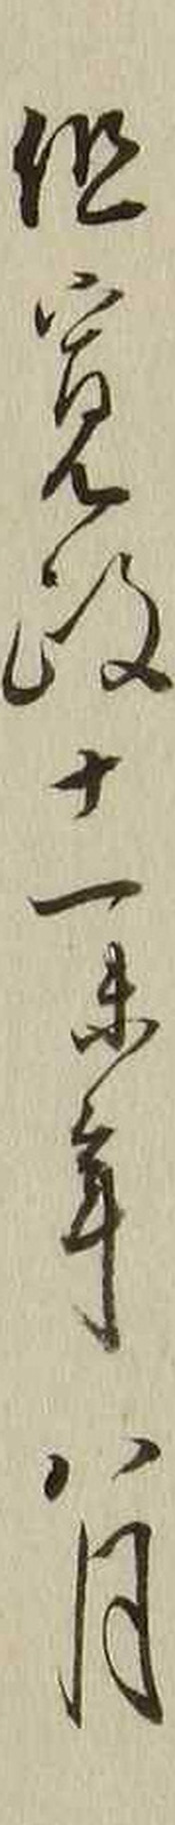但寛政十一未年八月
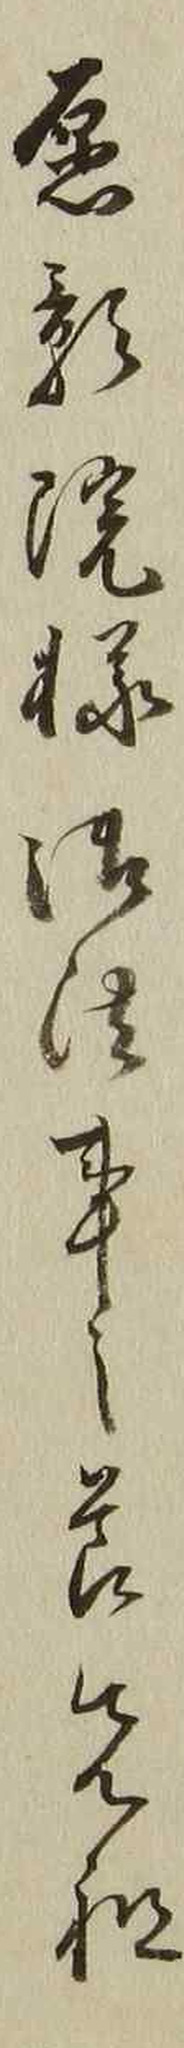愿影院様御法事之節先祖
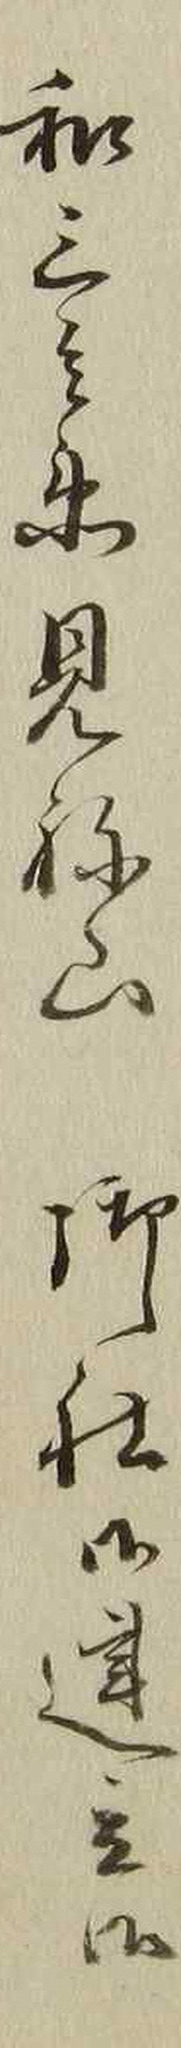和三兵衛見祢山御社御建立御
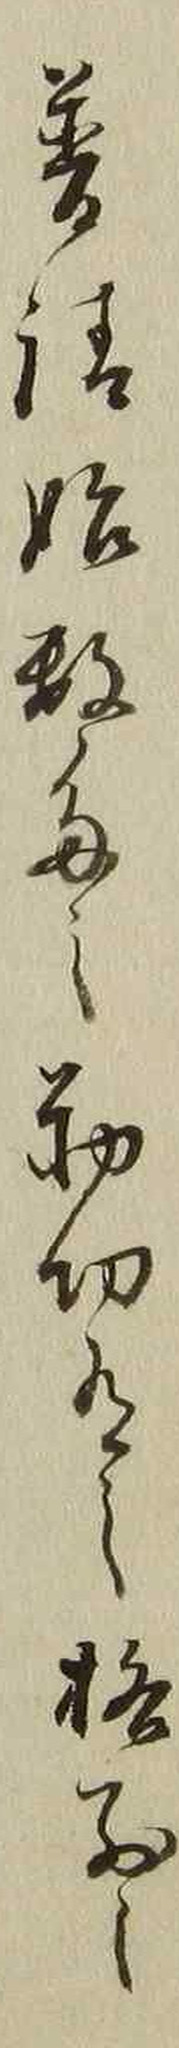普請始数多之勤功有之格別之
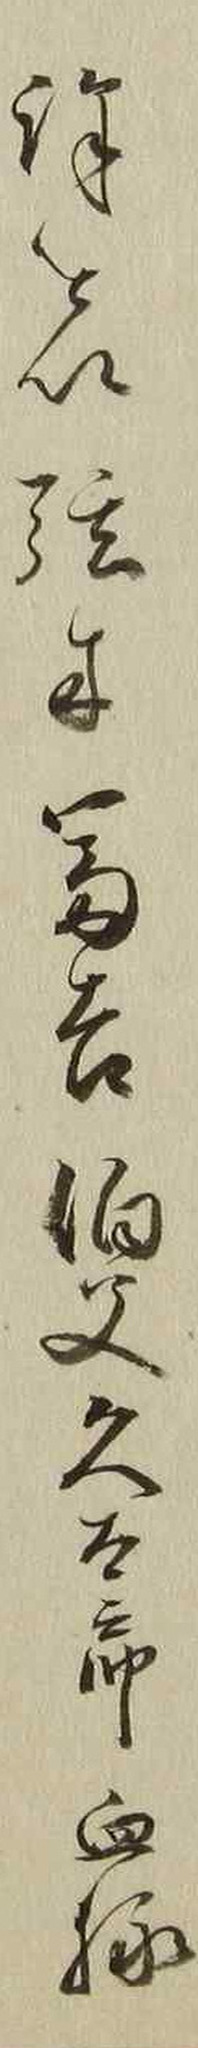許を以弦木富吉伯父久太郎血縁
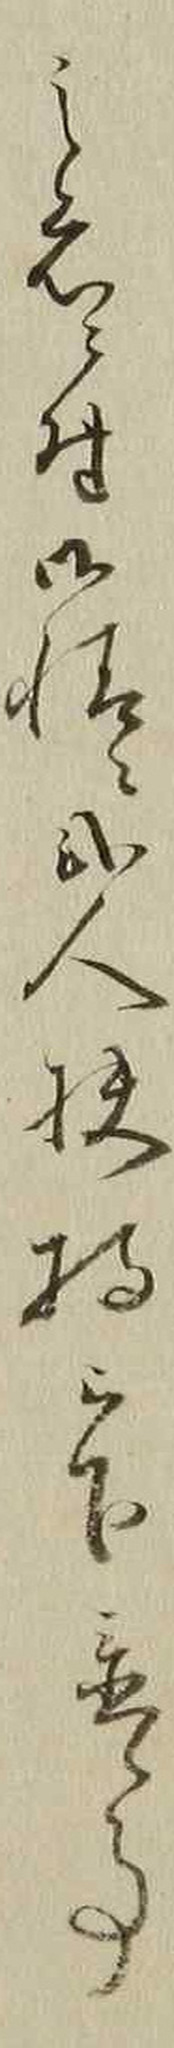之者ニ付御情ニ弐人扶持被下置候事
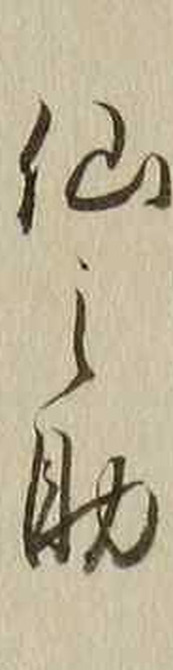仙之助
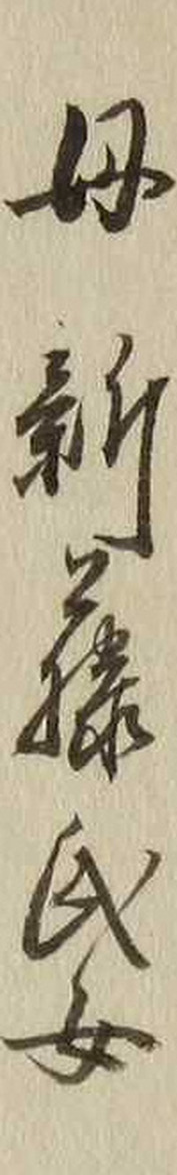母新藤氏女
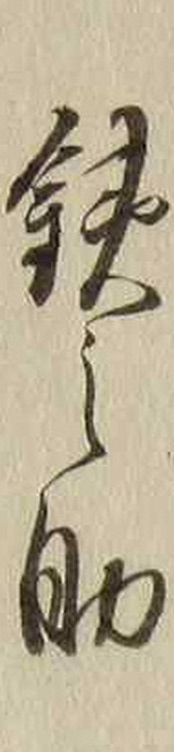鉄之助
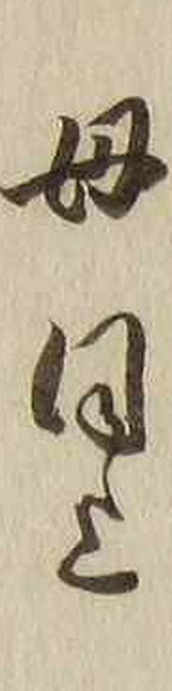母同上
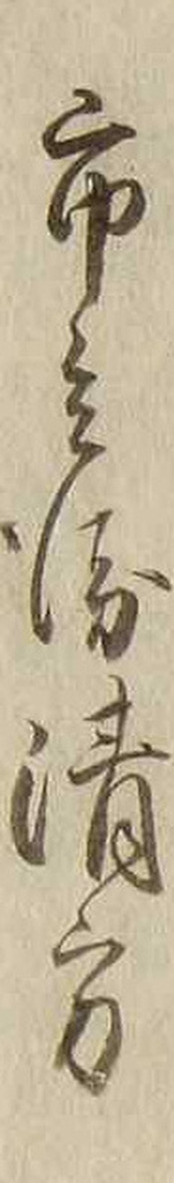市兵衛清方

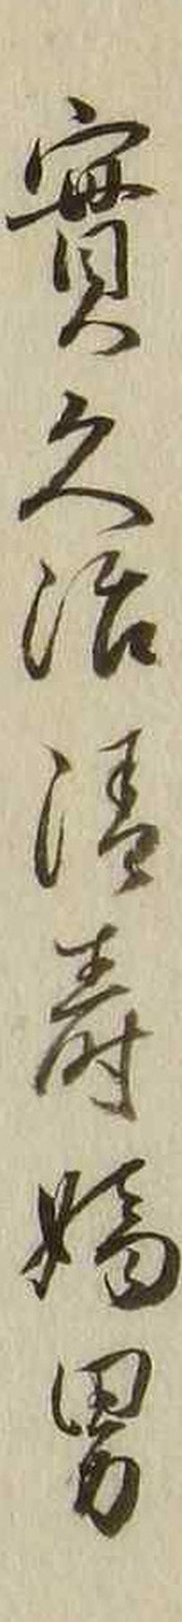実久治清寿嫡男
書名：諸士系譜　巻之28　い之部28
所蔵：会津若松市立会津図書館
